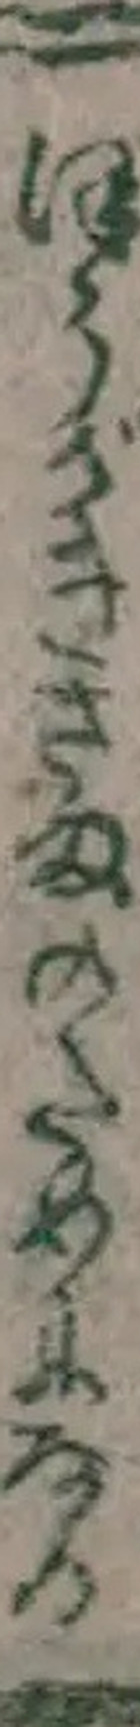ほうがきさまのためになり
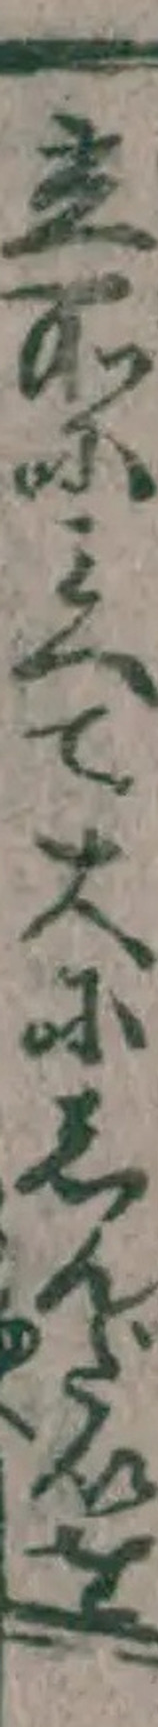立所にみへて大にしんだいを
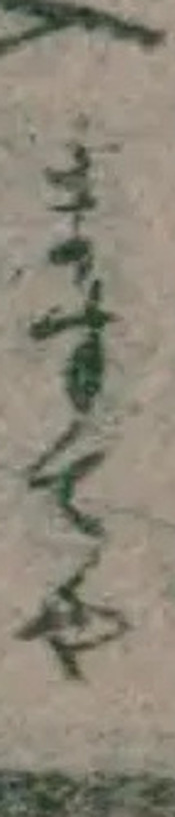ますてや
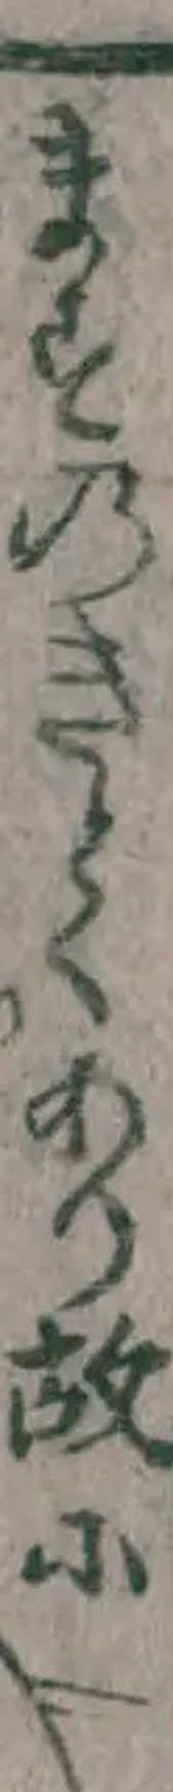ますのきとくあり故に
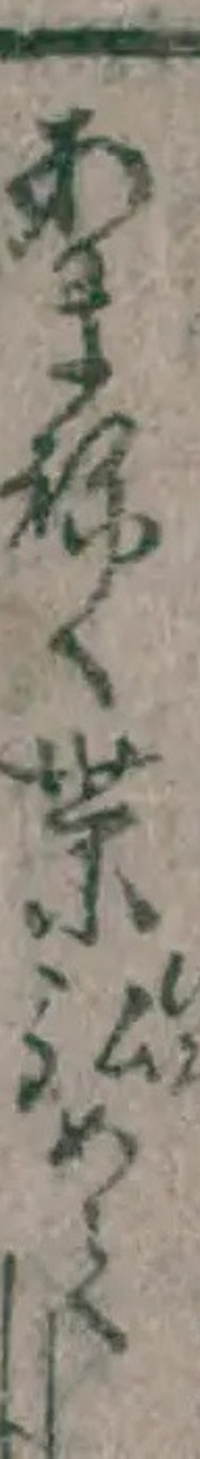あまねく薬弘めて
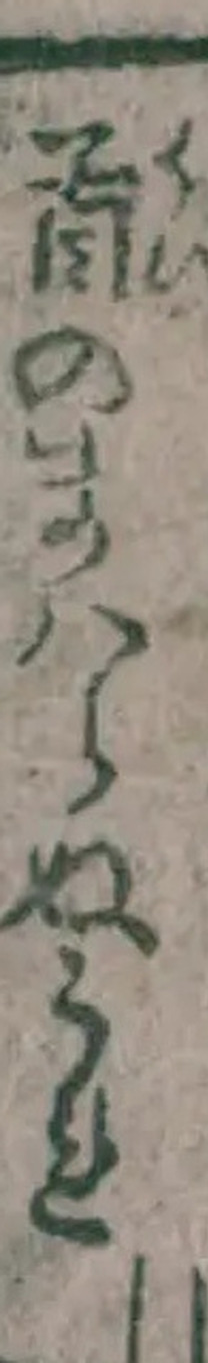首のまはらぬうれ
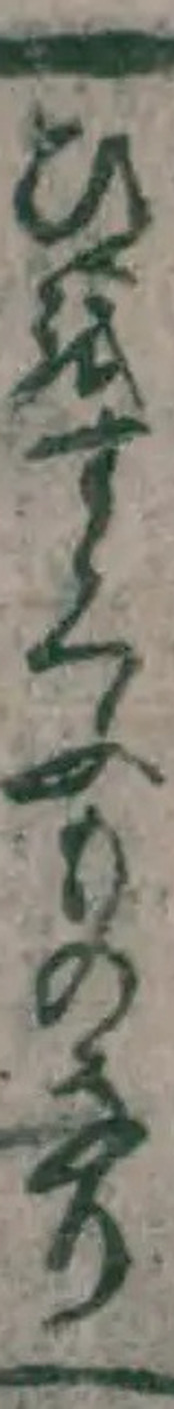ひをすくふものなり
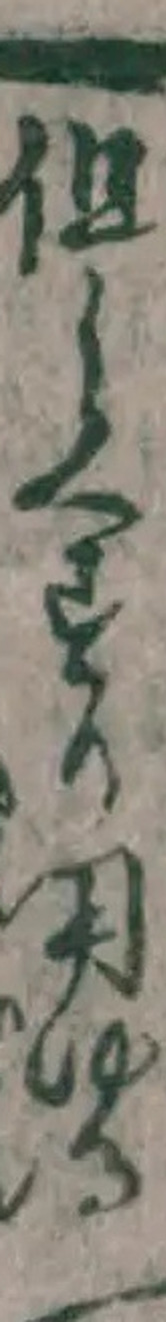但しくすり用ゆる
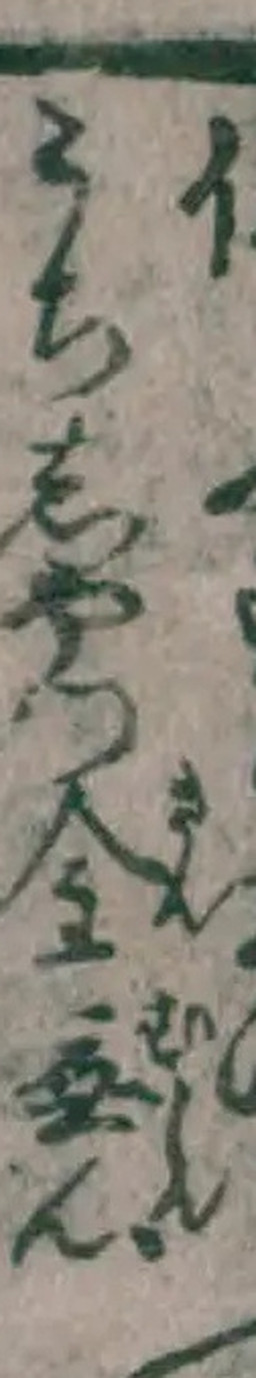うちしやつ金無心
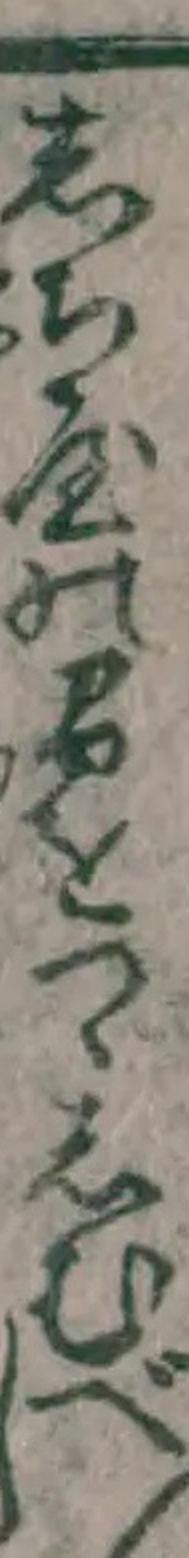しち屋の間をつゝしむべし
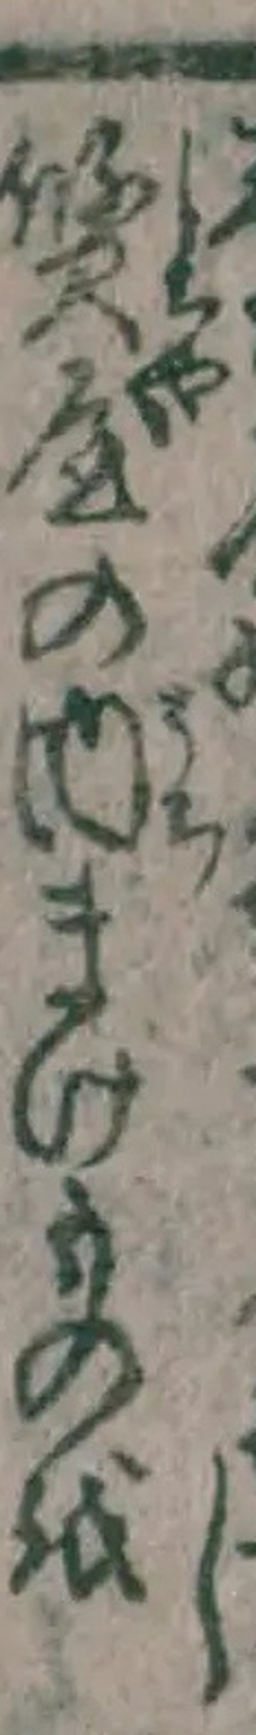質屋の内まけものを
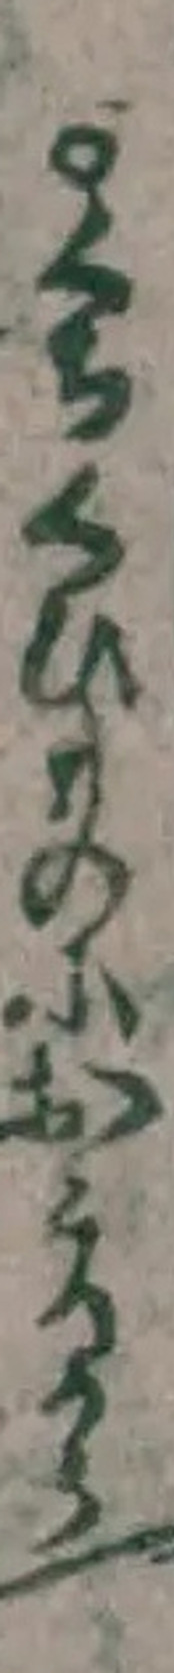○くちくひものにおこるから
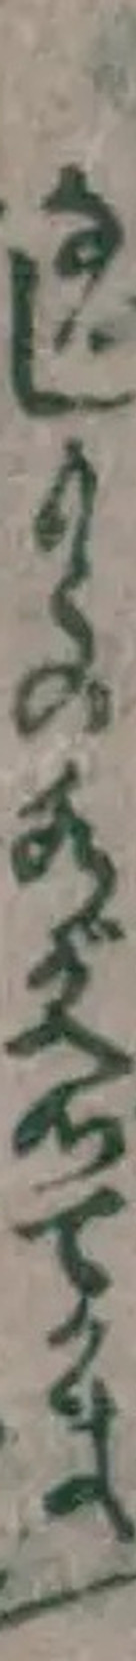ながしもとの水がへつてかま
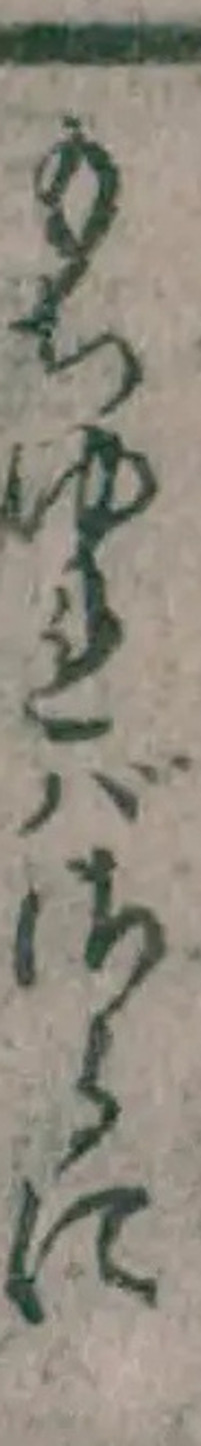もちゆればさらに
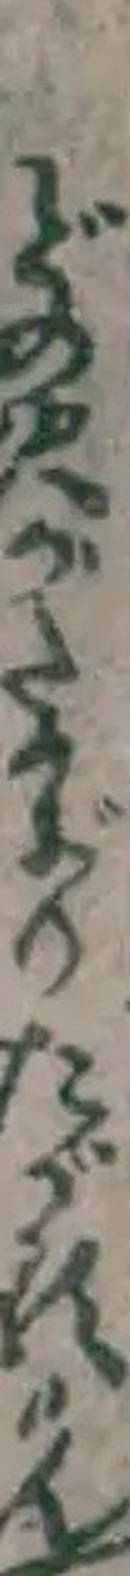どの火がたかぶりたがるけん
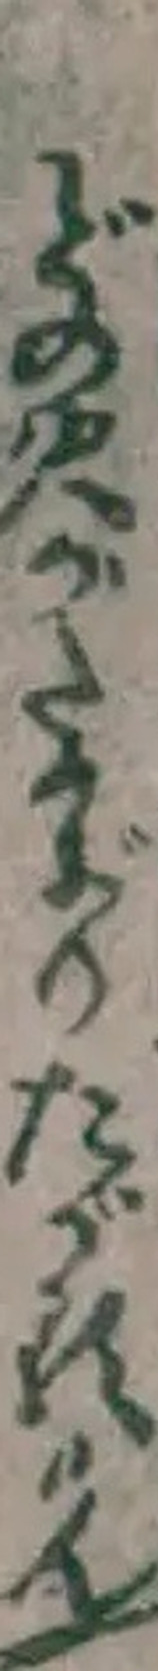どの火がたかぶりたがるけん
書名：視薬霞報条 3巻
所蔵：国立国会図書館 National Diet Library, JAPAN
